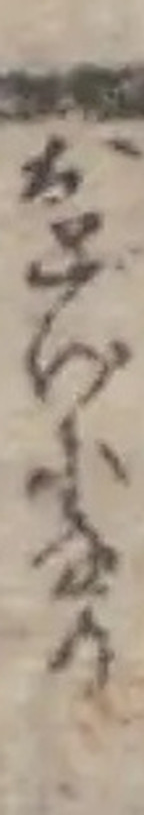おとけになつ
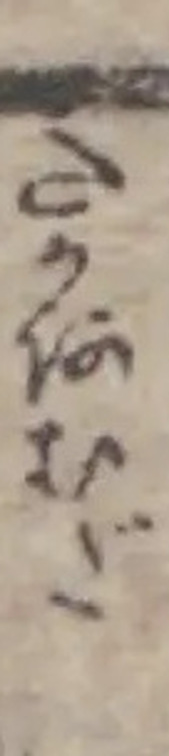たかあみだ
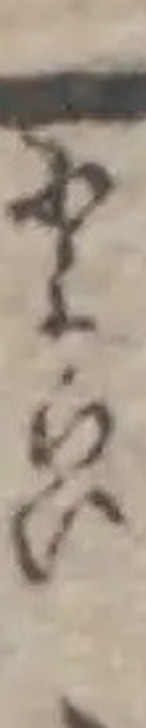によらい
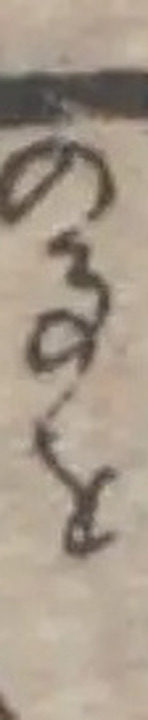の事を
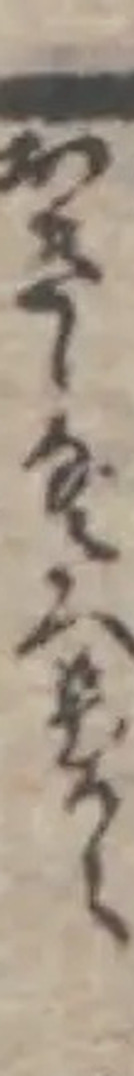おきゝなさへ是から
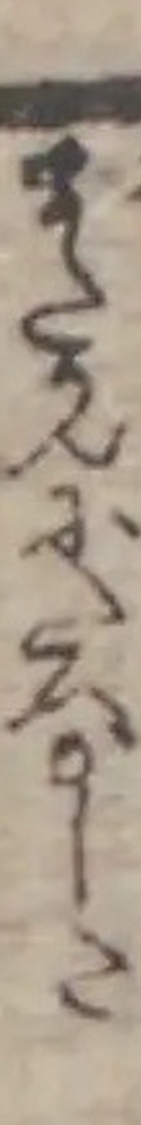またかんにたへかした
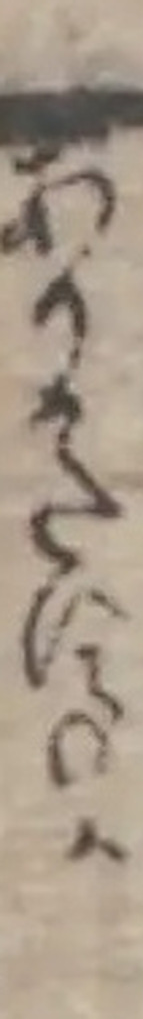ありかたい事か
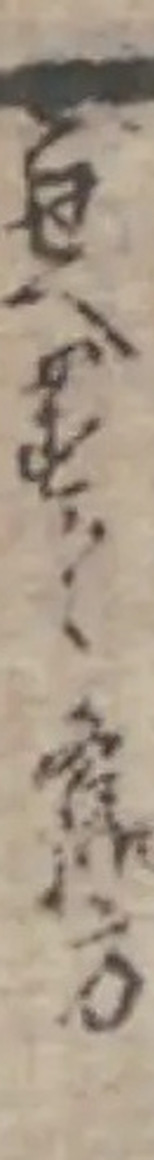ごせへやすから皆様方
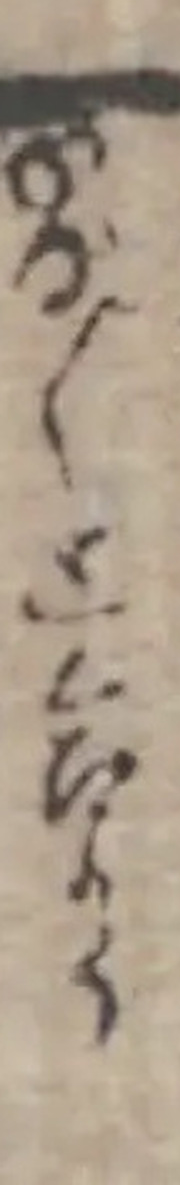ゆる〳〵とこちよう
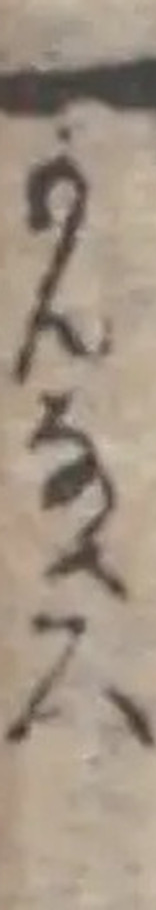もんなさへ
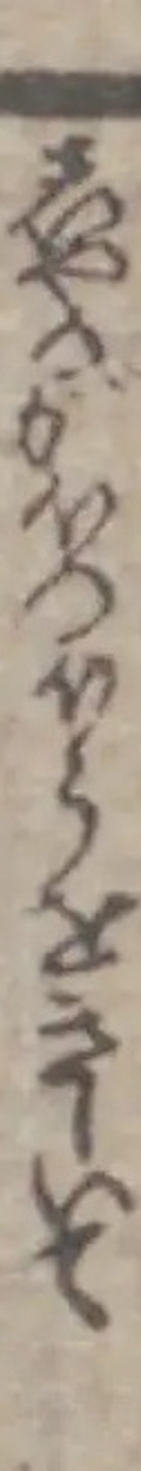しやかがほつほうをきゝいて
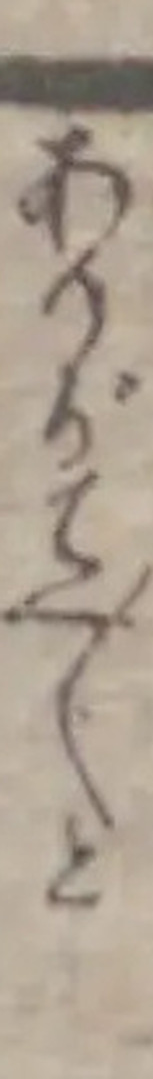ありがてへ〳〵と
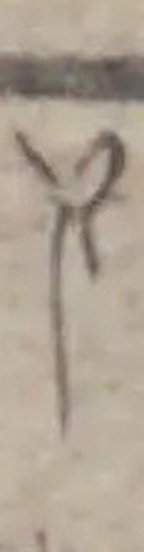いゝし
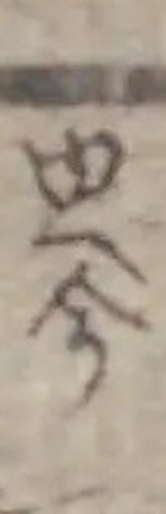ゆへ今
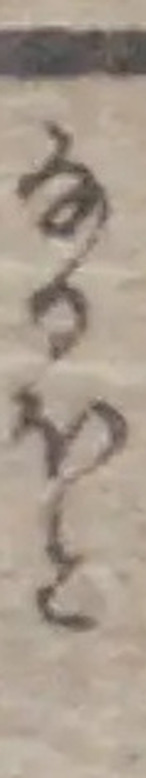なるほと

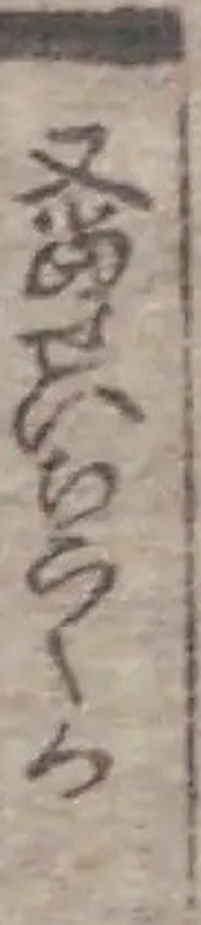又当せいちこくか
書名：早出来 3巻
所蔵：国立国会図書館 National Diet Library, JAPAN
